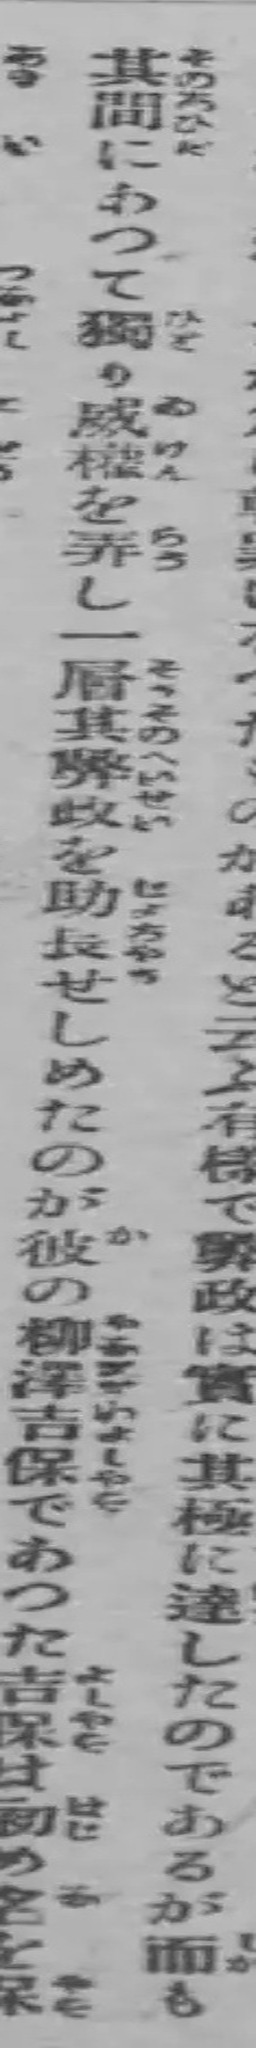其間にあつて独り威権を弄し一層其弊政を助長せしめたのが彼の柳沢吉保であつた吉保は初め名を保
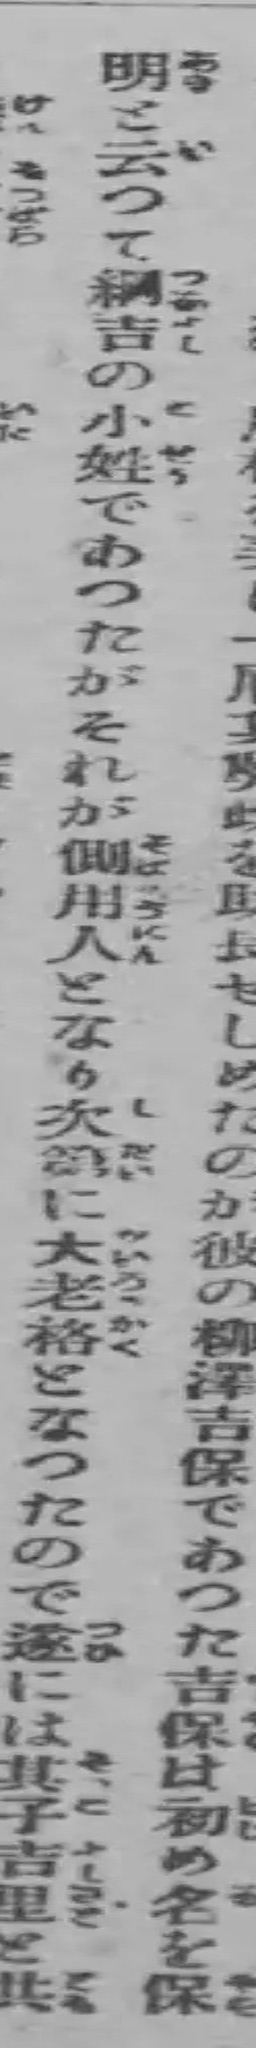明と云つて綱吉の小姓であつたがそれが側用人となり次第に大老格となつたので遂に其子吉里と共
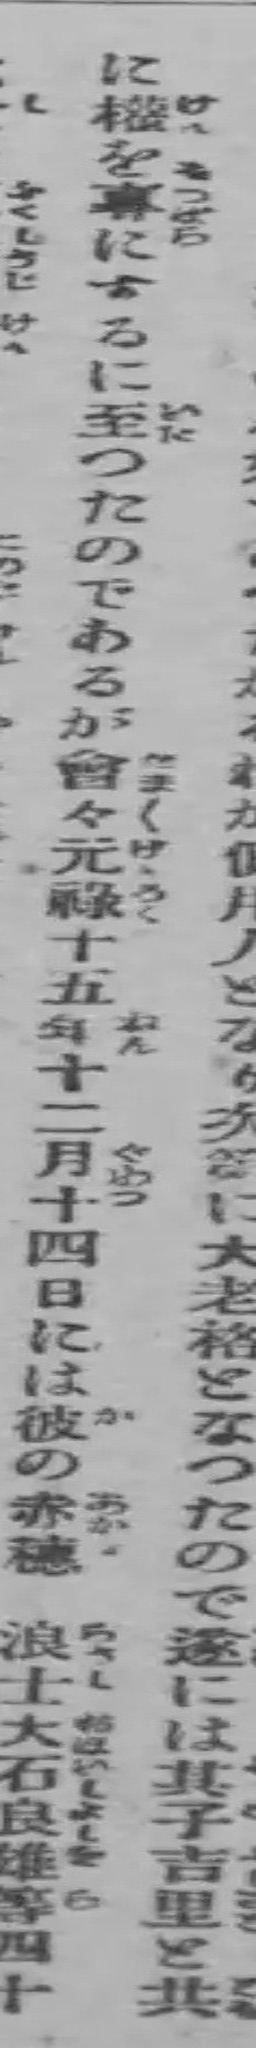の権を専にするに至つたのであるが会々元禄十五年十二月十四日には彼の赤穂の浪士大石良雄等四十
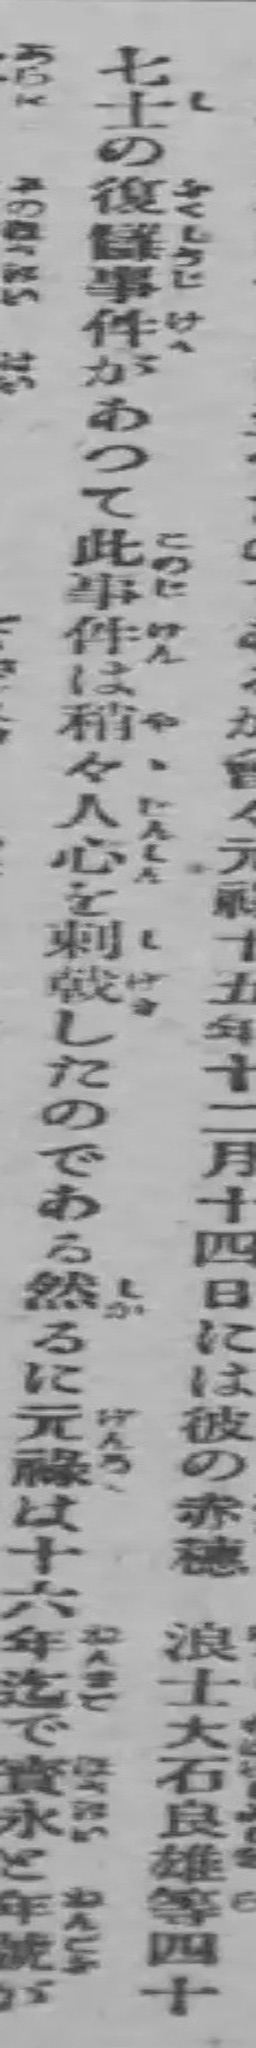七士の復讐事件があつて此事件は稍々人心を刺激したのである然るに元禄は十六年迄で宝永と年号が
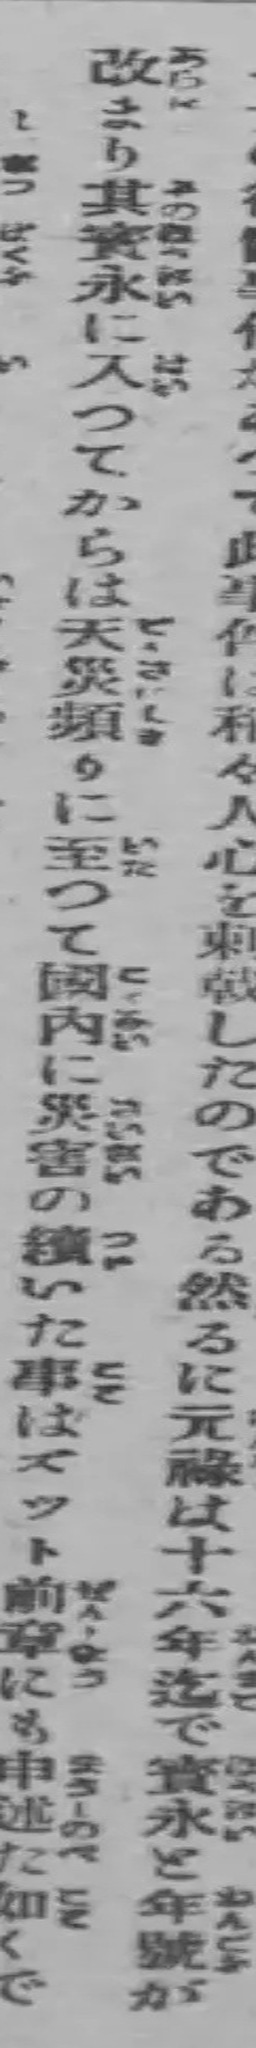改まり其宝永に入つてからは天災頻りに至つて国内に災害の続いた事はズツト前章にも申述た如くで
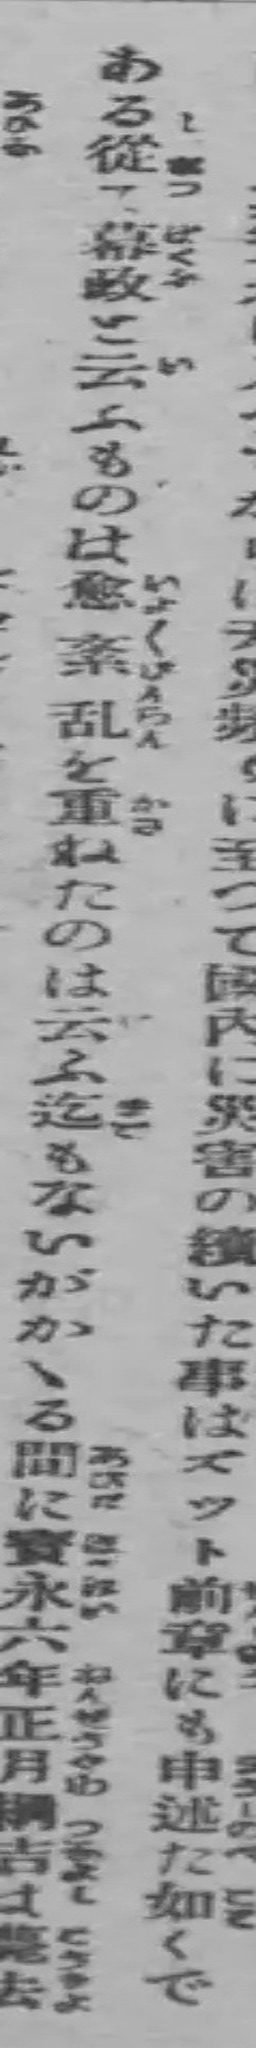ある従て幕政と云ふものは愈紊乱を重ねたのは云ふ迄もないがかゝる間に宝永六年正月綱吉は薨去
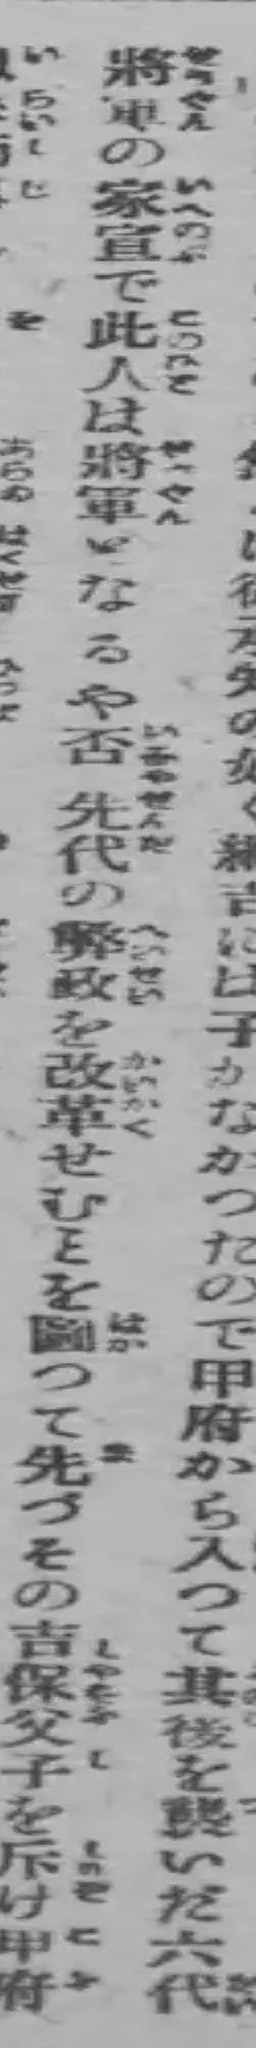将軍の家宣で此人は将軍となるや否先代の弊政を改革せむことを図つて先づその吉保父子を斥け甲府
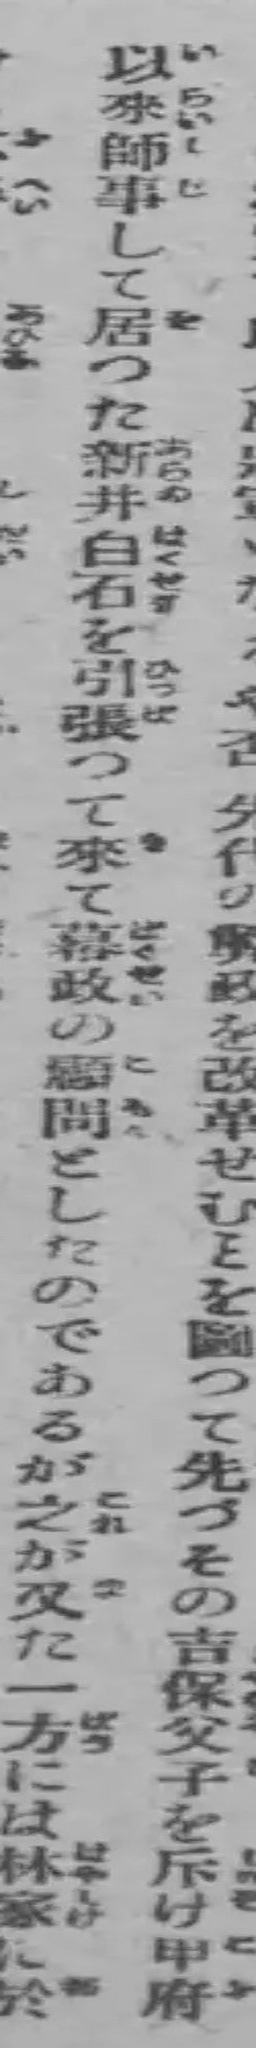以来師事して居つた新井白石を引張つて来て幕政の顧問としたのであるが之が又た一方には林家に於
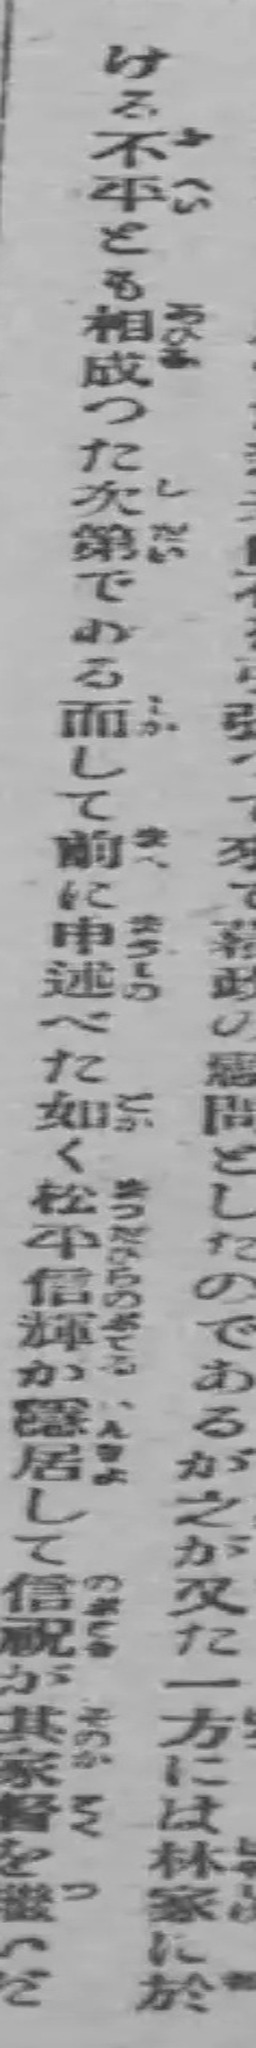ける不平とも相成つた次第である而して前に申述べた如く松平信輝か隠居して信祝が其家督を継いだ
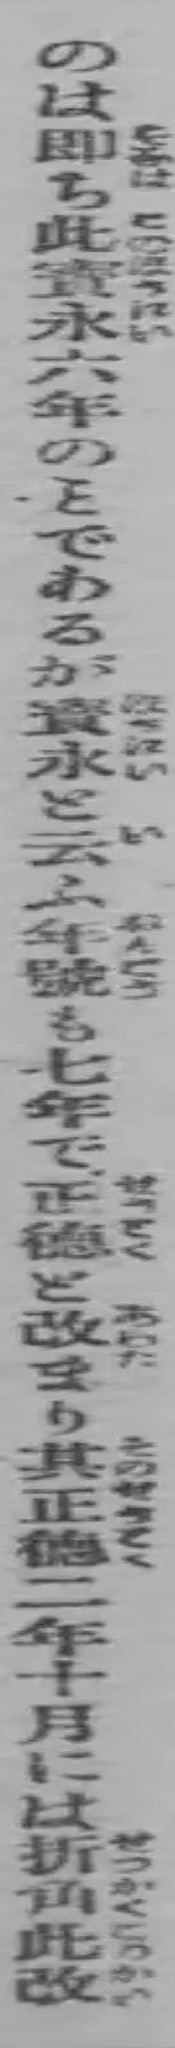のは即ち此宝永六年のことであるが宝永と云ふ年号も七年で正徳と改まり其正徳二年十月には折角此改
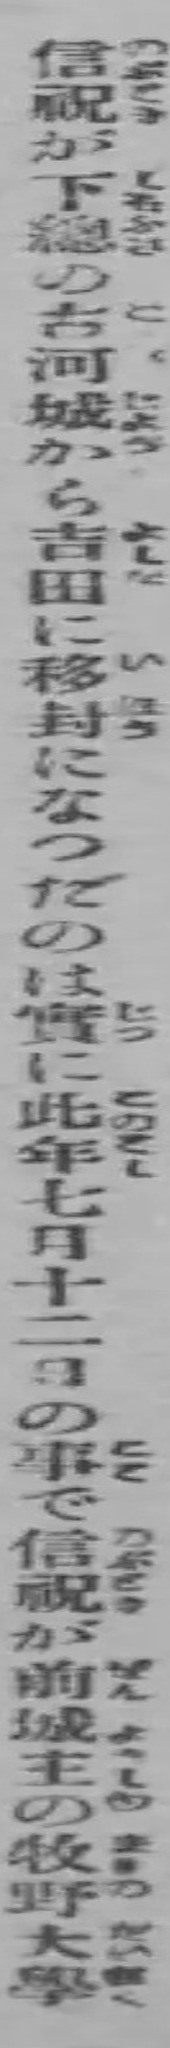信祝が下総の古河城から吉田に移封になつたのは実に此年七月十二日の事で信祝が前城主の牧野大学
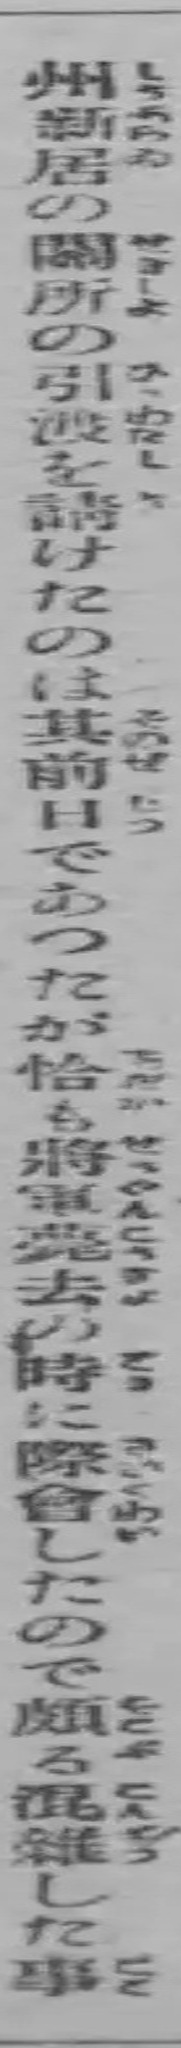州新居の関所の引渡を請けたのは其前日であつたが恰も将軍薨去の時に際会したので頗る混雑した事
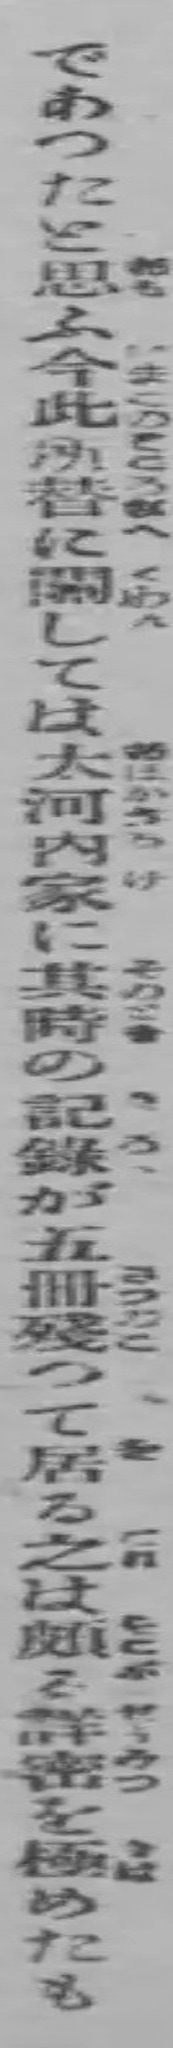であつたと思ふ今此所替に関しては大河内家に其時の記録が五冊残つて居る之は頗詳密を極めたも
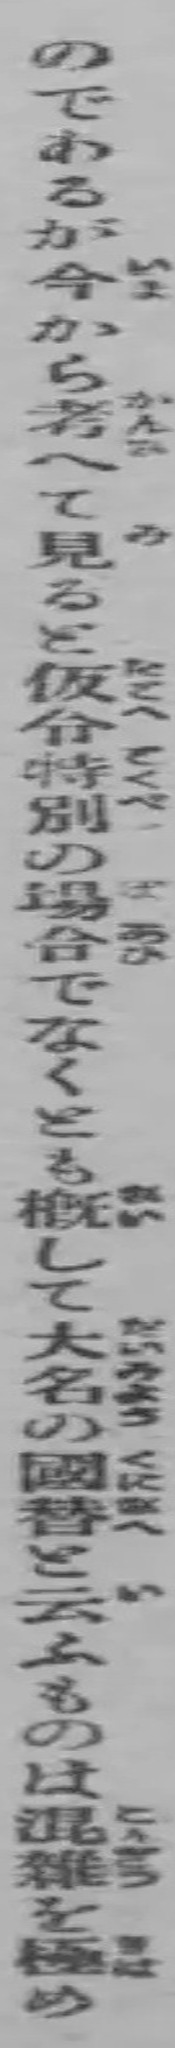のであるが今から考へて見ると仮令特別の場合でなくとも概して大名の国替と云ふものは混雑を極め
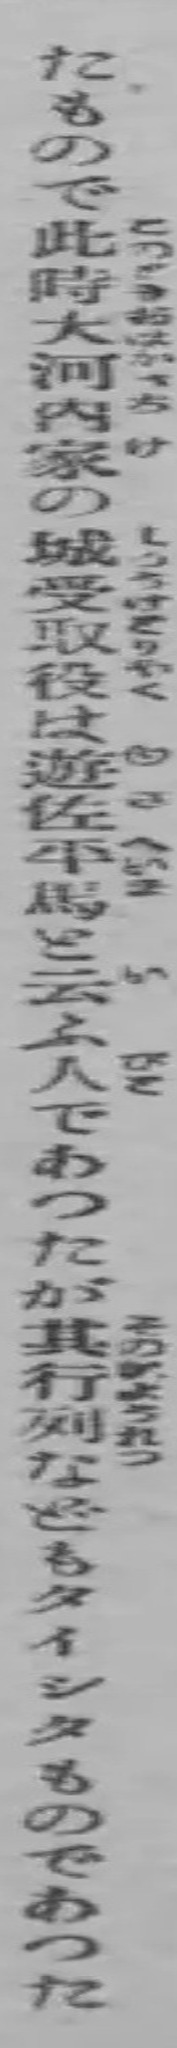遊佐平馬たもので此時大河内家の城受取役は遊佐平馬と云ふ人であつたが其行列などもタイシタものであつた
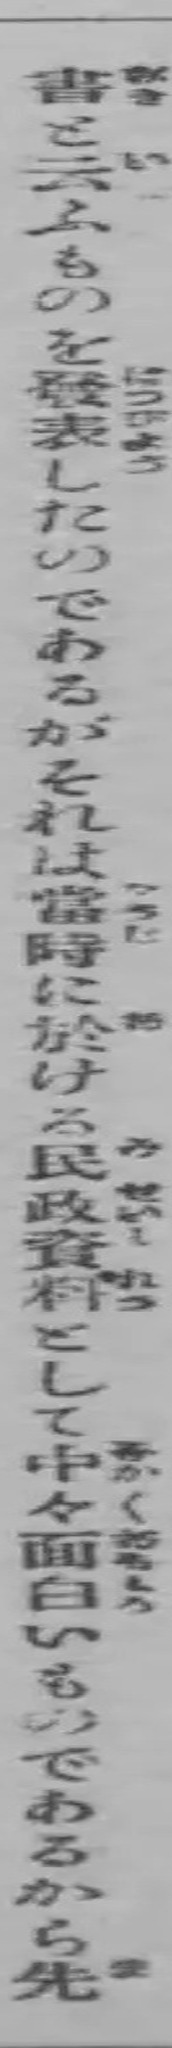書と云ふものを発表したのであるがそれは当時に於ける民政資料として中々面白いものであるから先
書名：豊橋市史談
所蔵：国立国会図書館 National Diet Library, JAPAN
